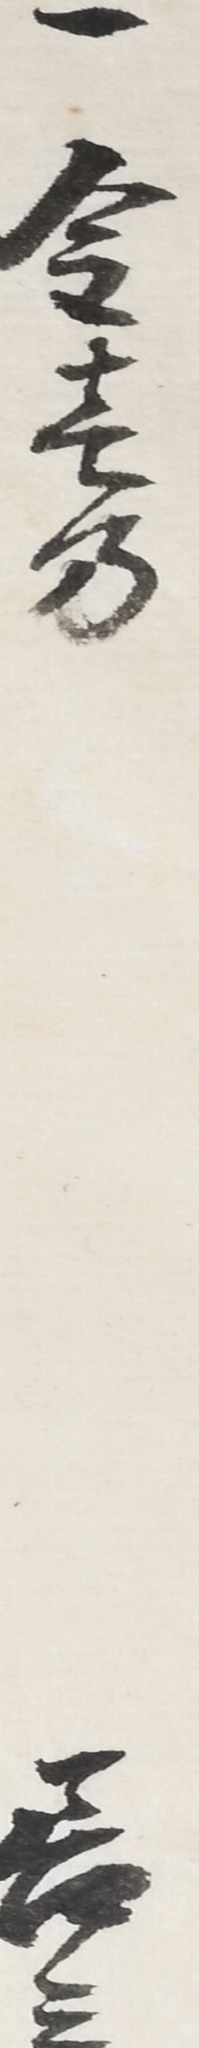一金壱分善兵衛
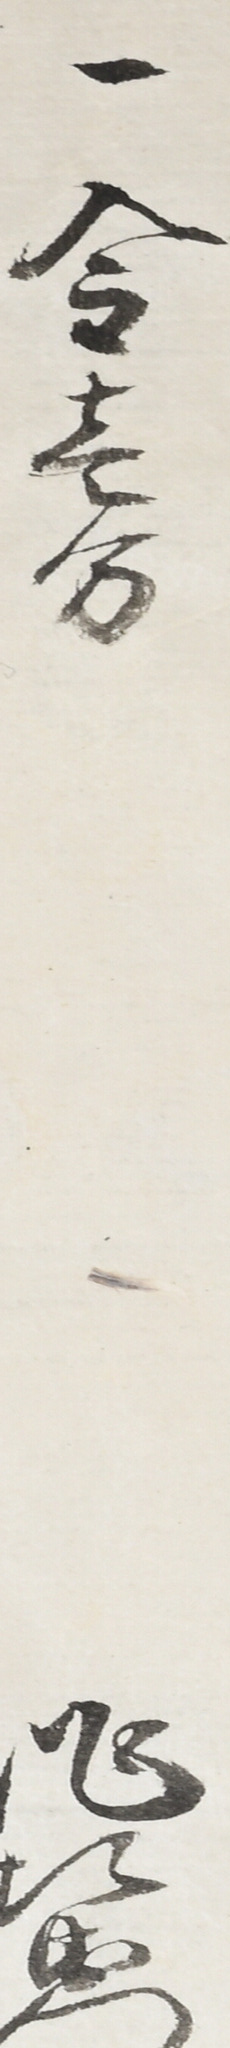一金壱分作左衛門
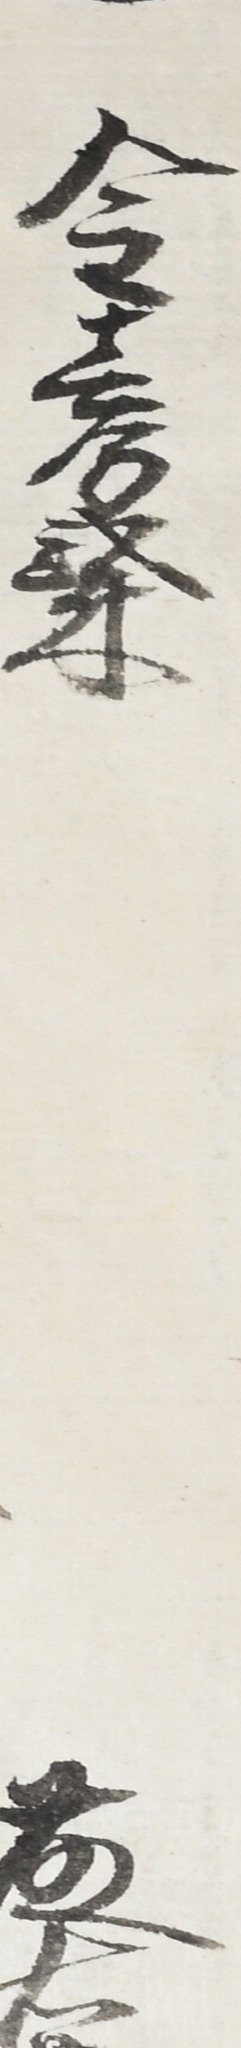一金壱分弐朱藤右衛門
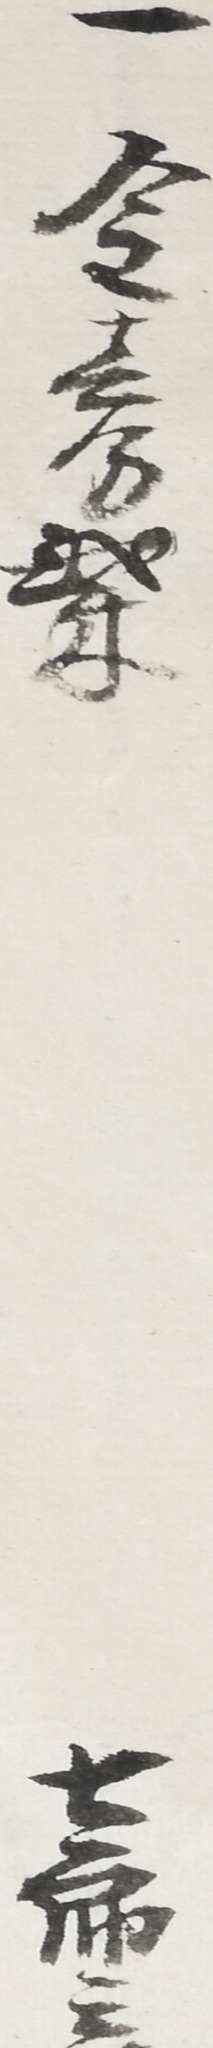一金壱分弐朱七郎兵衛

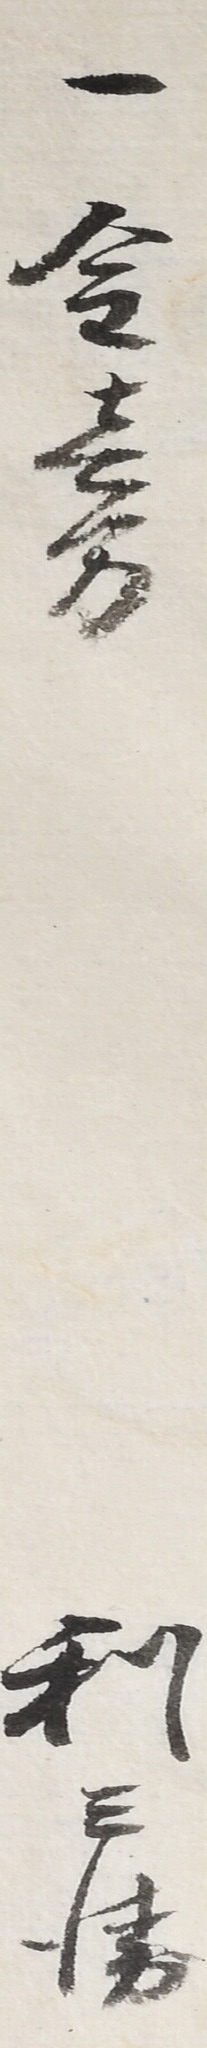一金壱分利兵衛
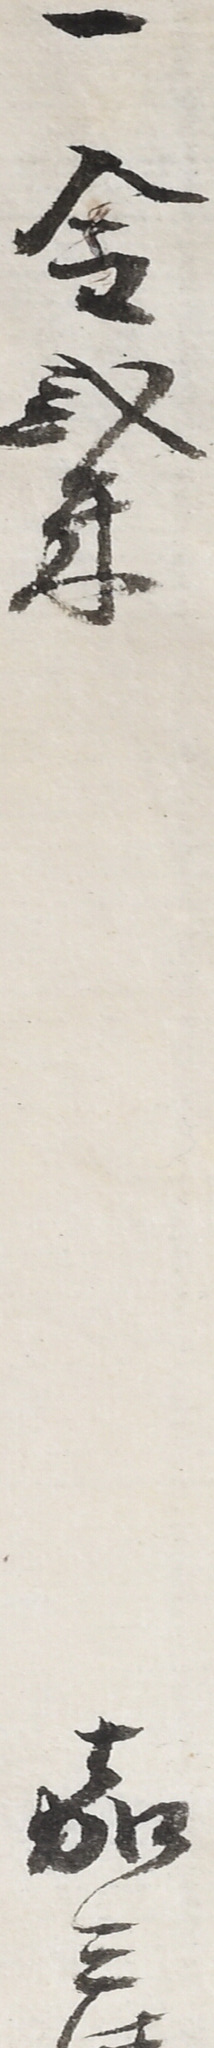一金弐朱嘉兵衛
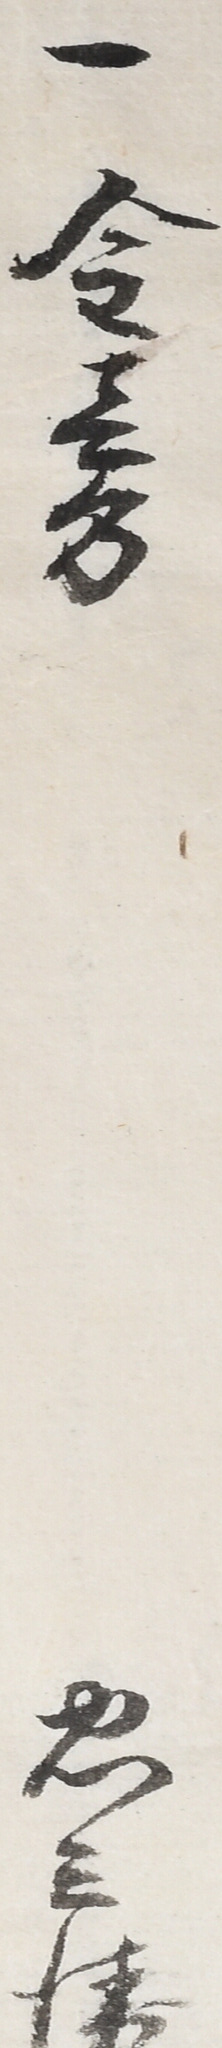一金壱分忠兵衛
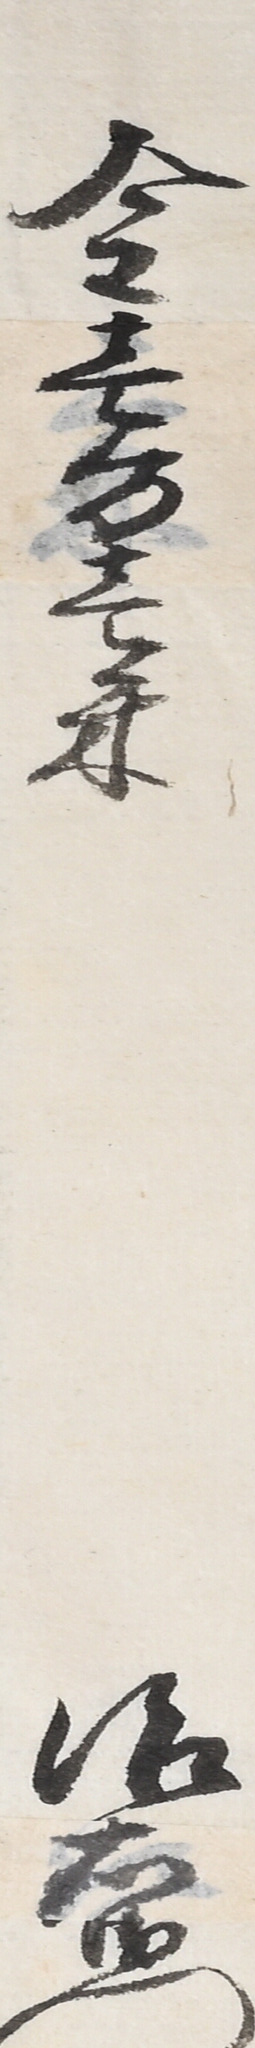一金壱分壱朱治右衛門
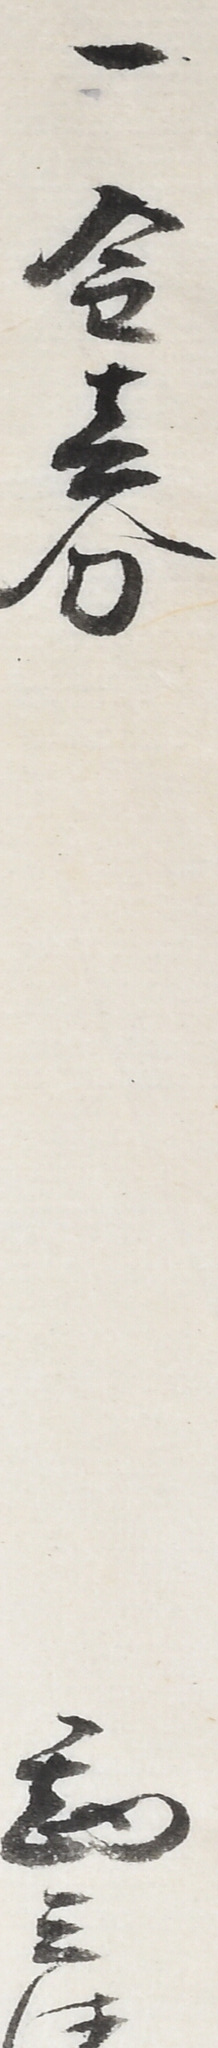一金壱分勘兵衛
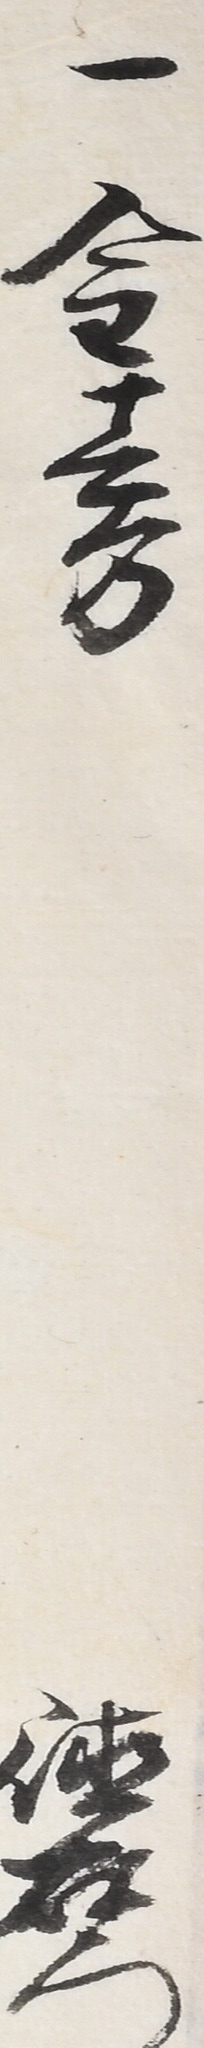一金壱分徳右衛門
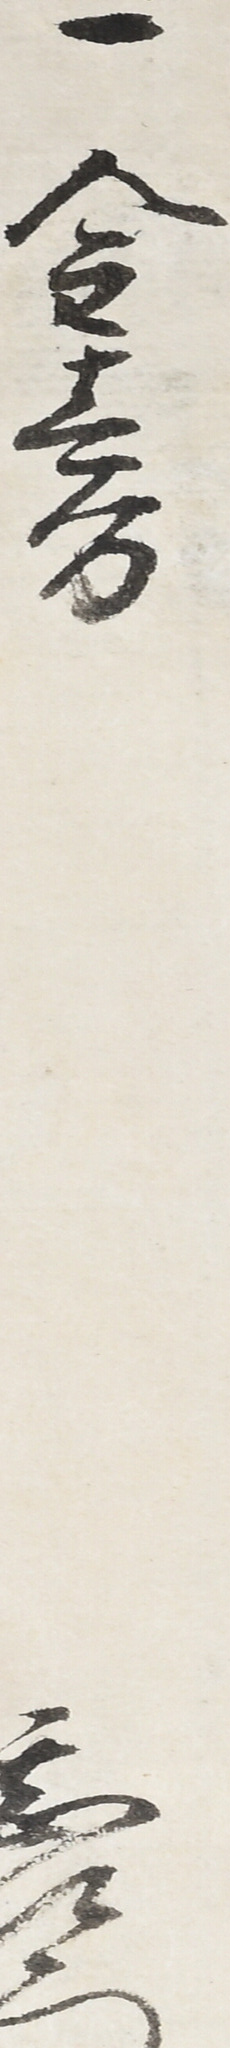一金壱分甚左衛門
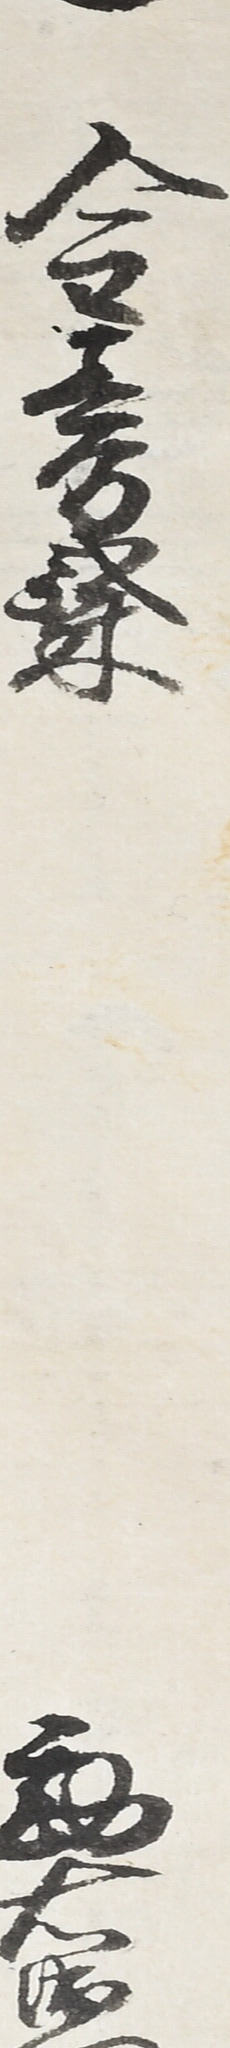一金壱分弐朱勘右衛門
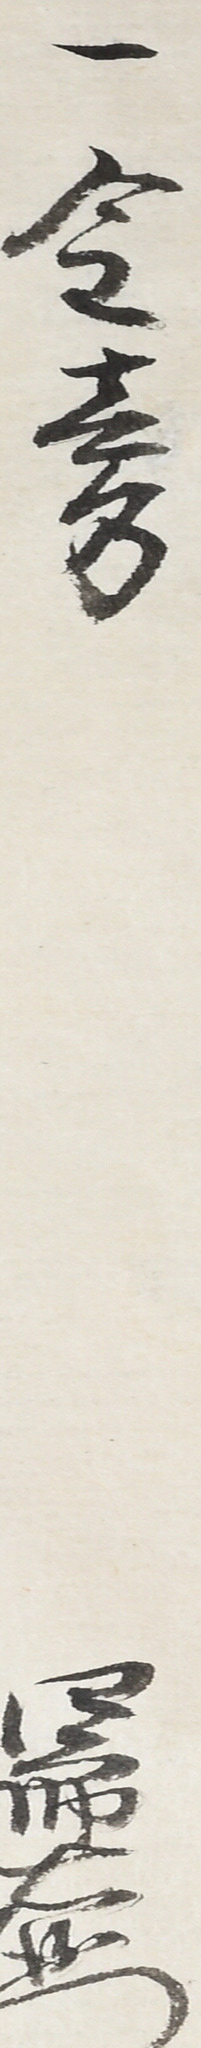一金壱分四郎右衛門

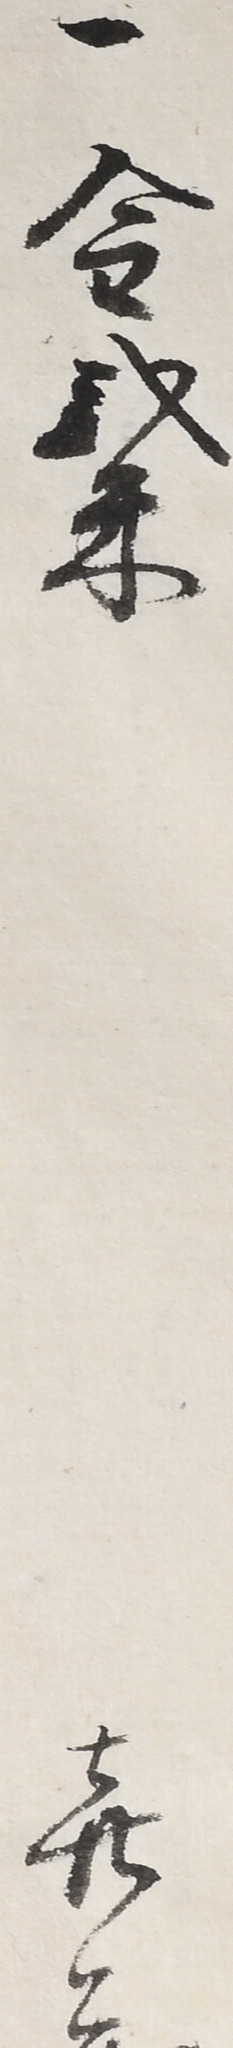一金弐朱喜蔵
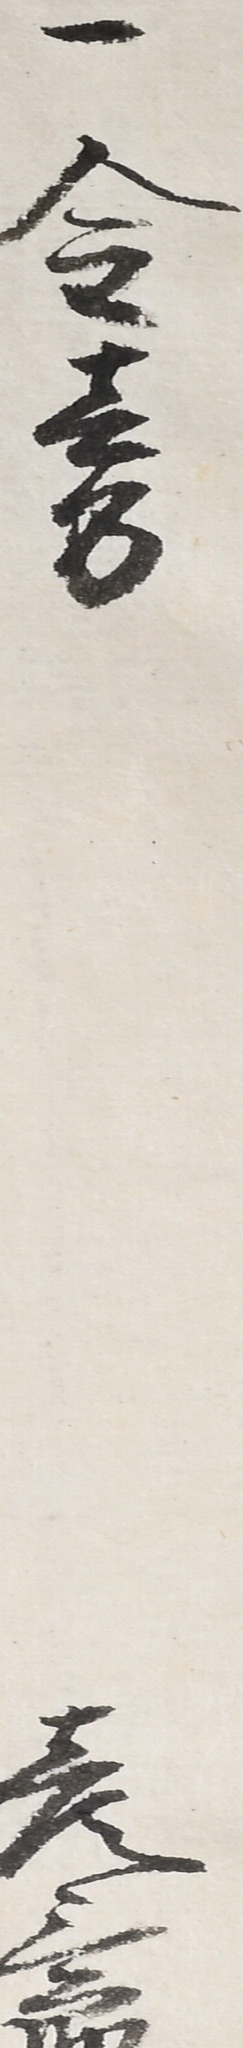一金壱分彦三郎
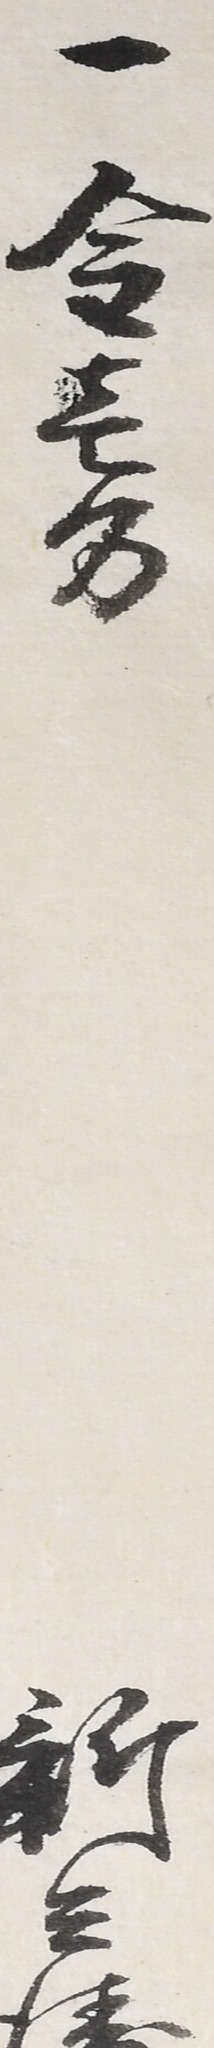一金壱分新兵衛
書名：御拝地百五拾年御祝儀献上御目録名前
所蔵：伊那市立高遠町図書館・合同会社AMANE
